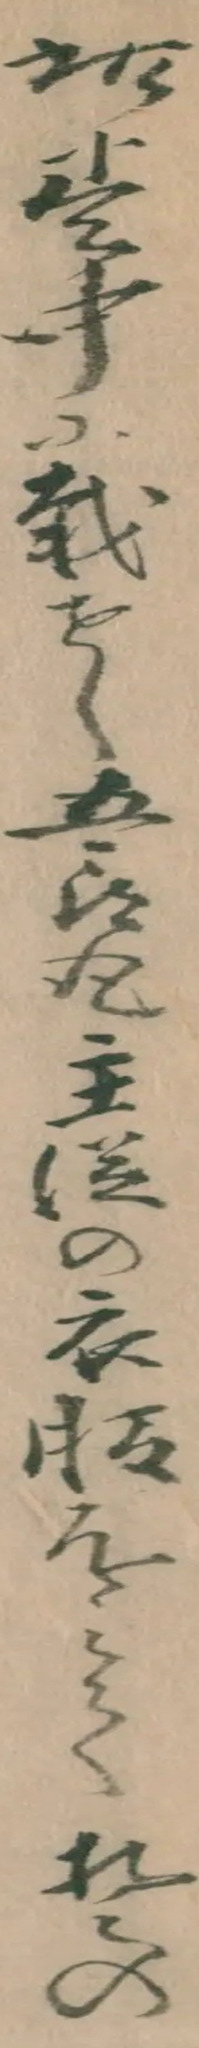此巻事に載せし五郎丸主従の衣服をみてその
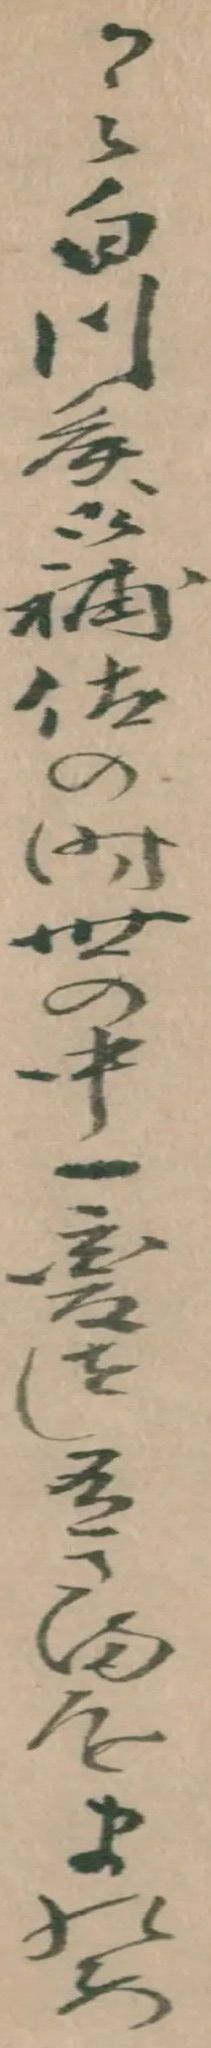かみ白川侯御補佐の時世の中一変をし有さまをまのあ
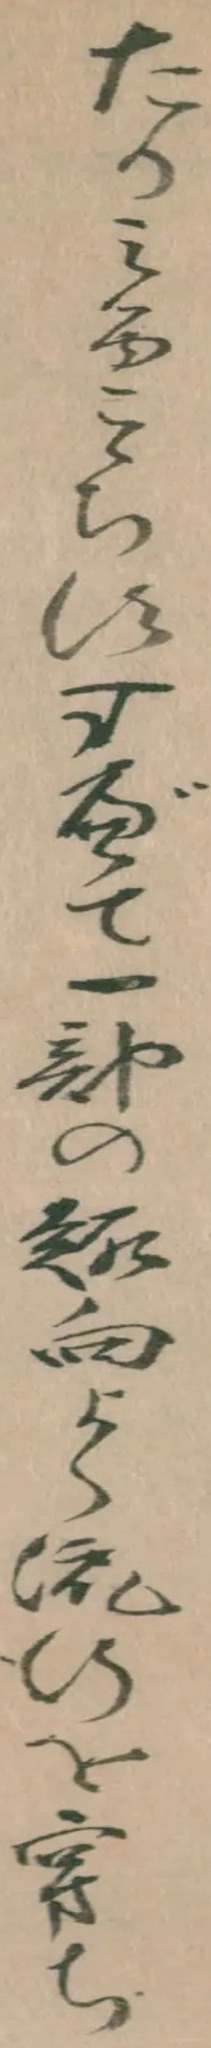たりみるこゝちすべて一部の趣向よく流行を穿ち
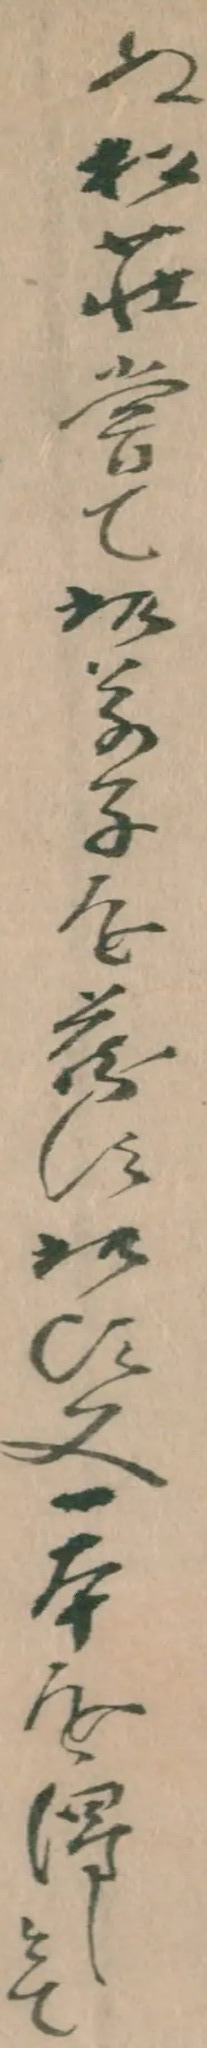ぬ此荘嘗て此草子を蔵す此頃又一本を得しとて
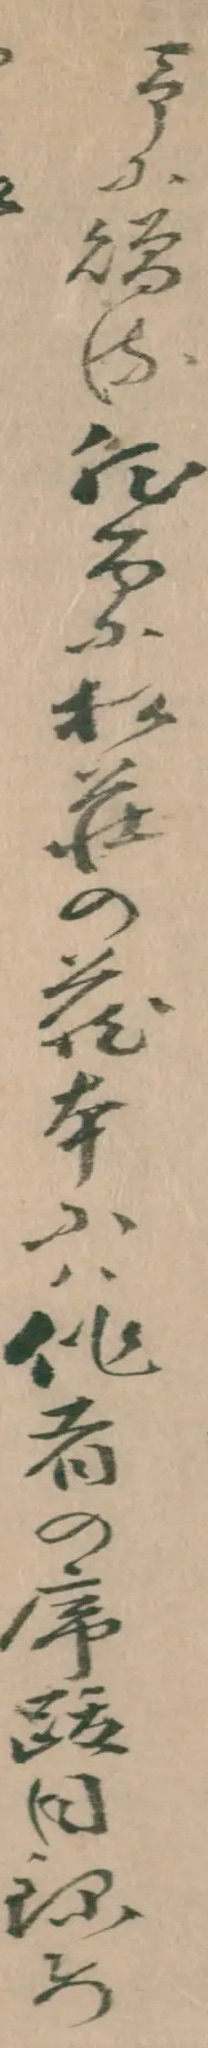予に贈る然而に此荘の蔵本には作者の序跋目録あ
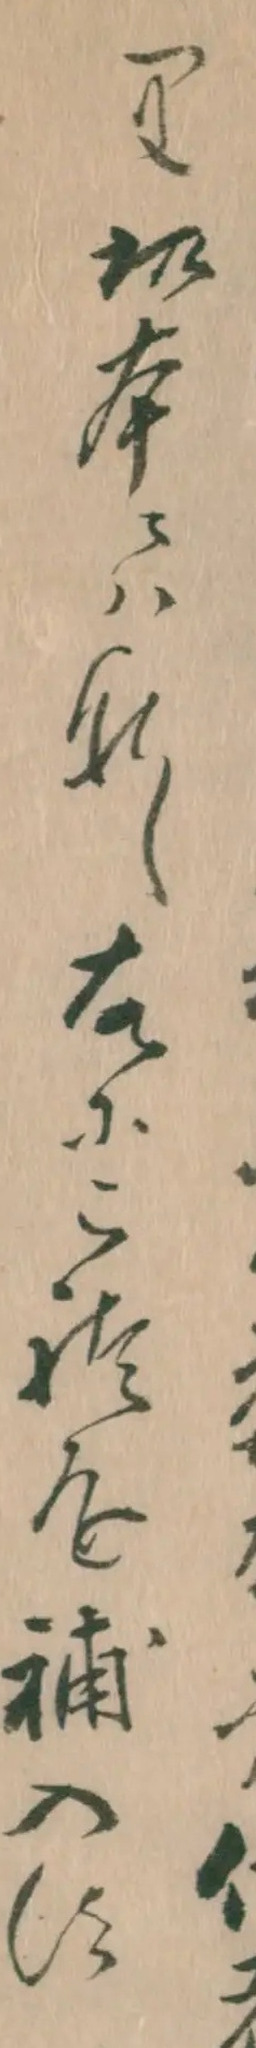り此本にはなし故にこれを補入す
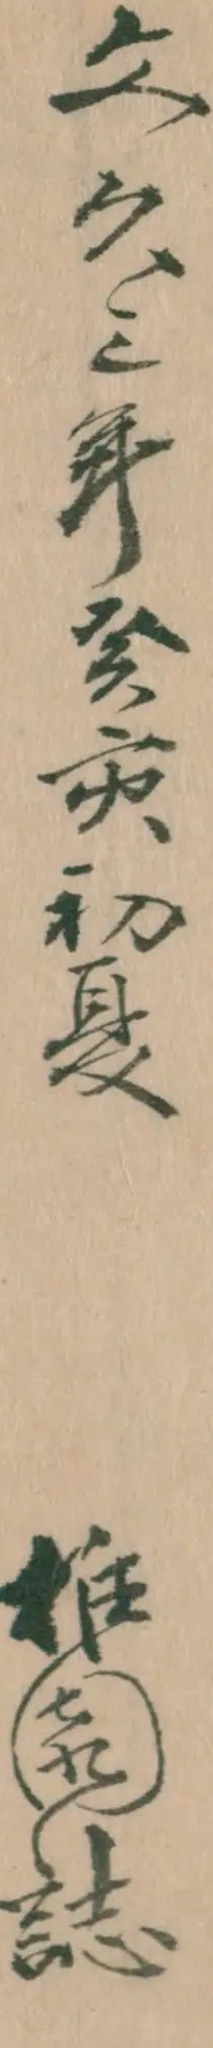文久三年癸亥初夏椎園誌
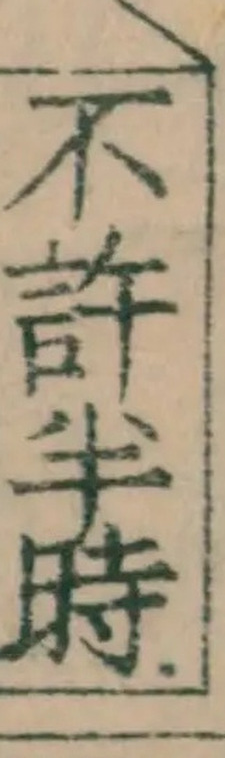不許半時
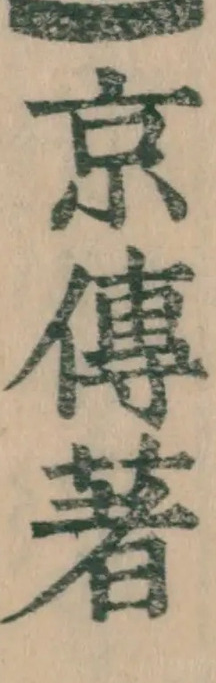京伝著
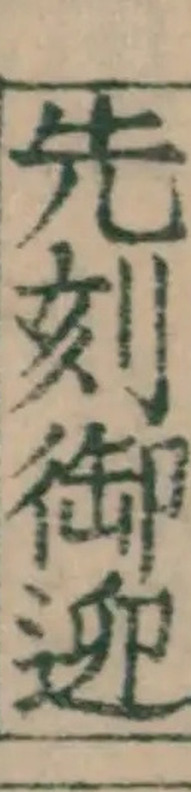先刻御迎
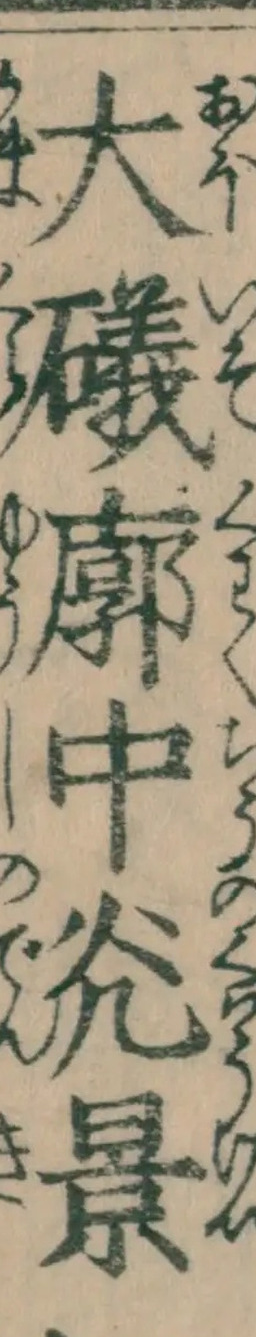大磯廓中光景
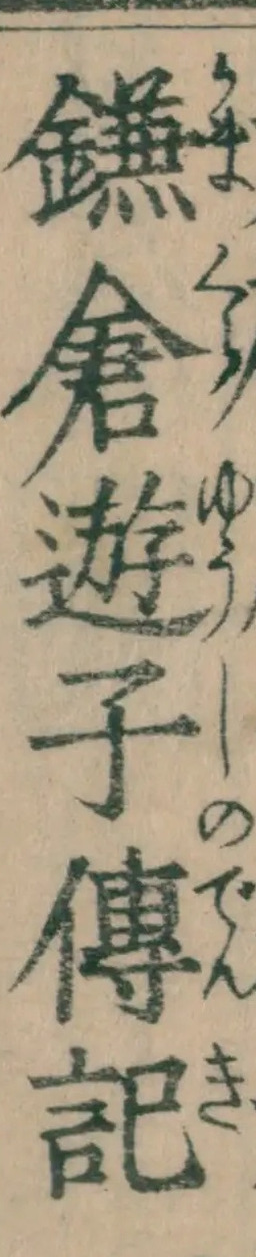鎌倉遊子伝記
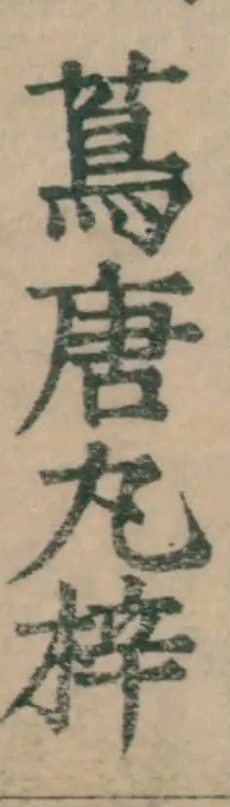蔦唐丸梓

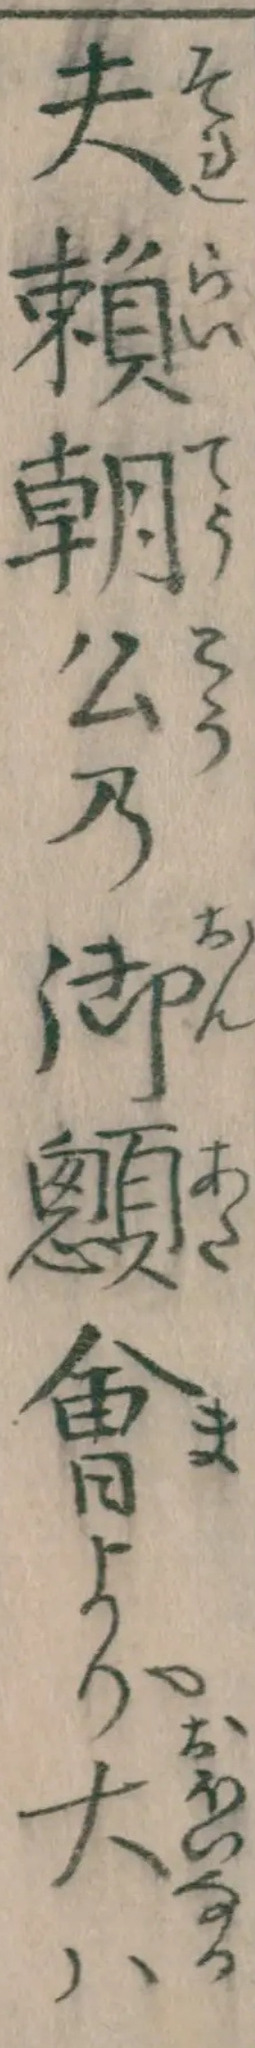夫頼朝公の御顖会より。大は
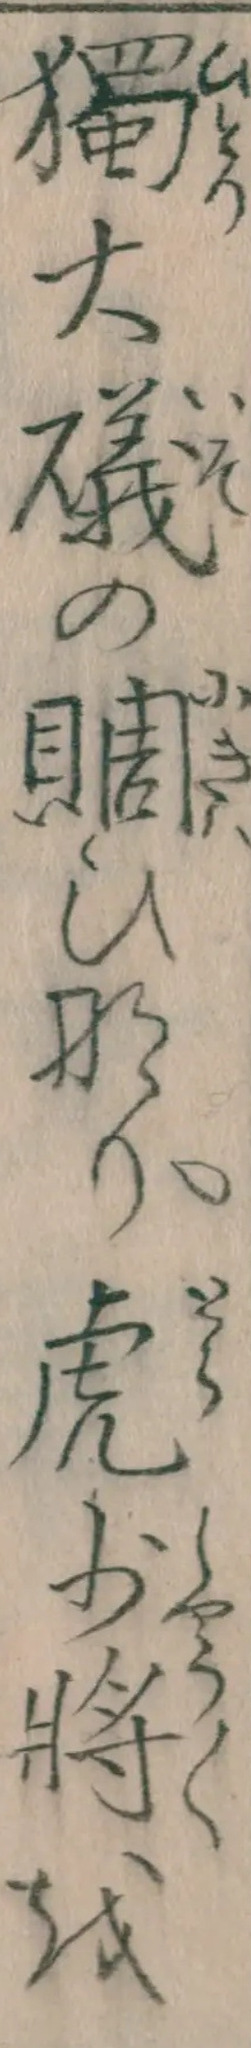独大磯の賙ひなり。虎少将を
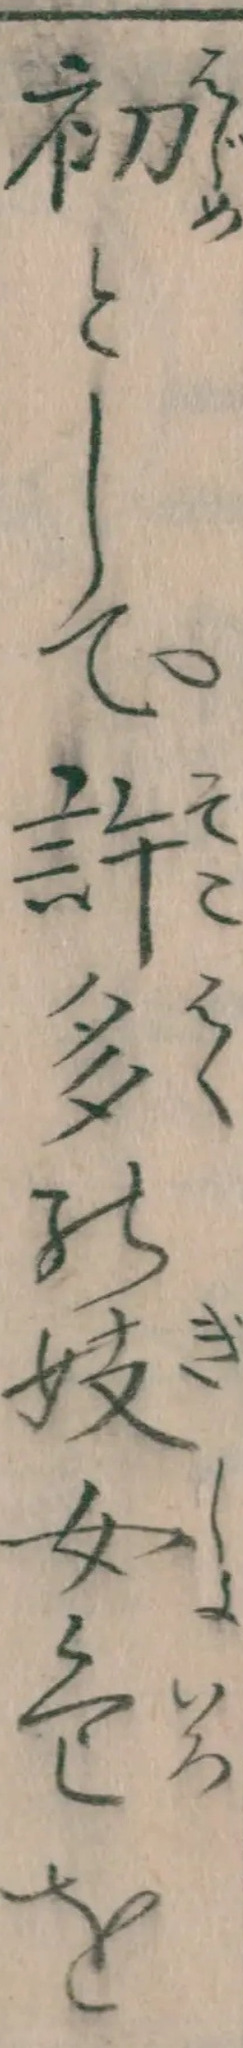初として。許多の妓女色を
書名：教訓読本：大礒風俗仕懸文庫
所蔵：国立国会図書館 National Diet Library, JAPAN
